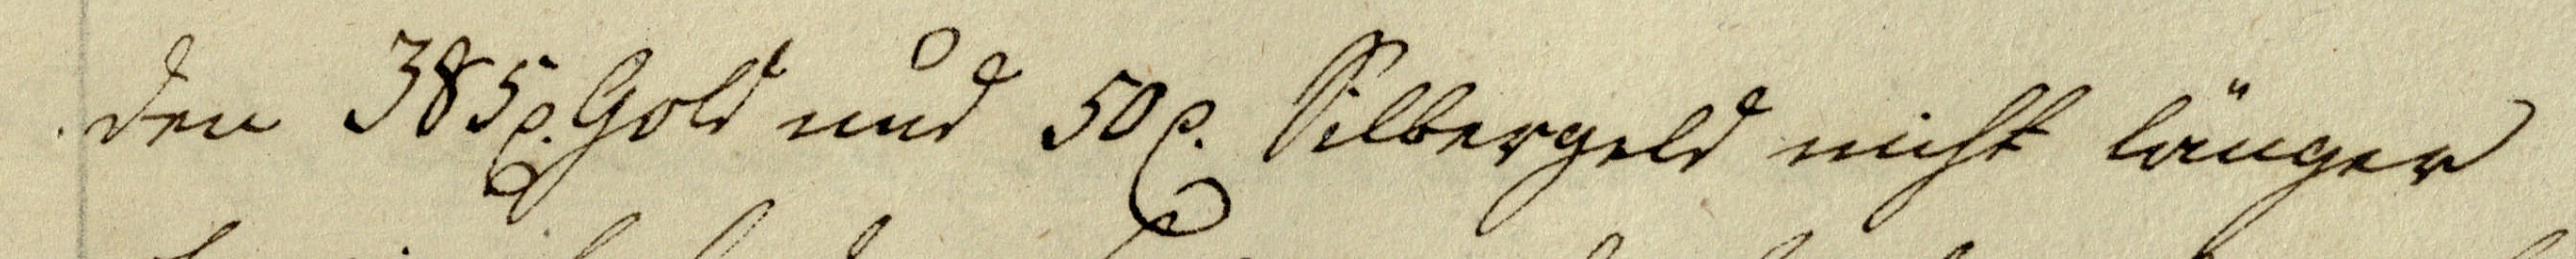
den 385 l. Gold und 50 l. Silbergeld nicht länger
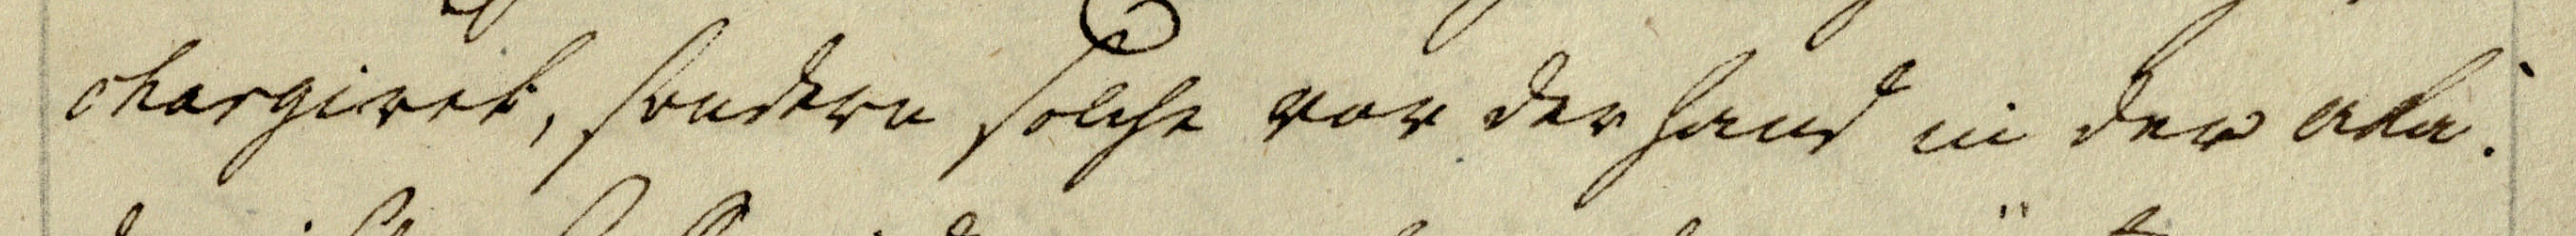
chargiret, sondern solche vor der Hand in der aka¬
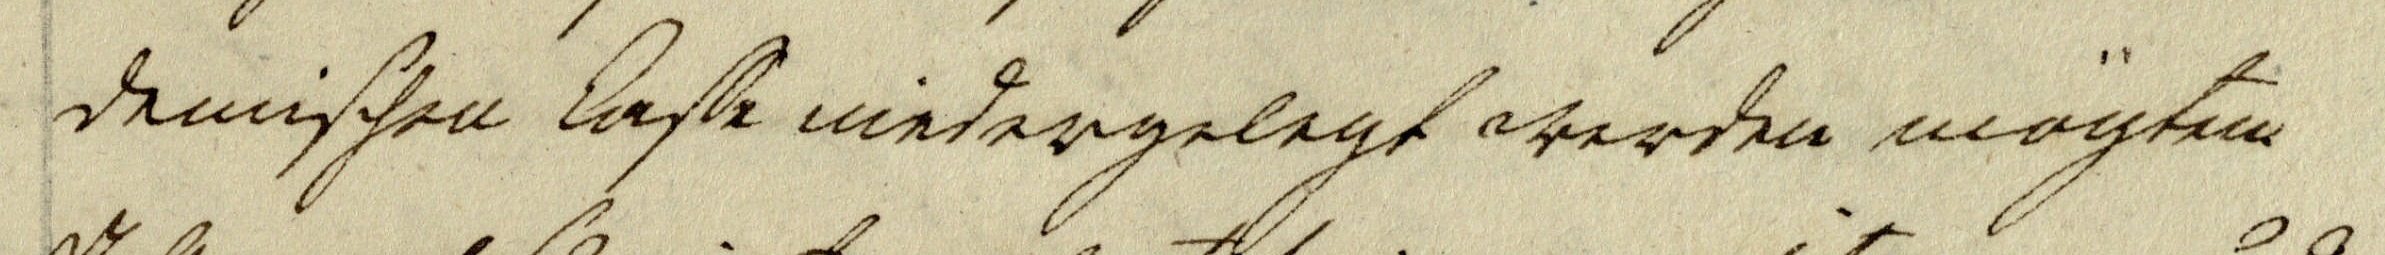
demischen Casse niedergelegt werden mögten.
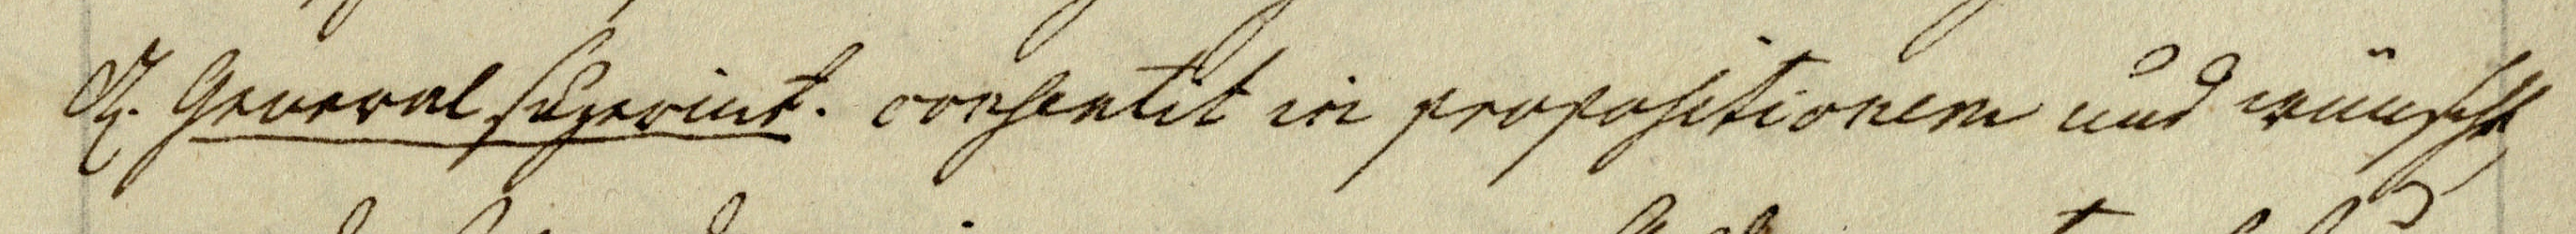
dh. Generalsuperint. consentit in propositionem und wünscht,
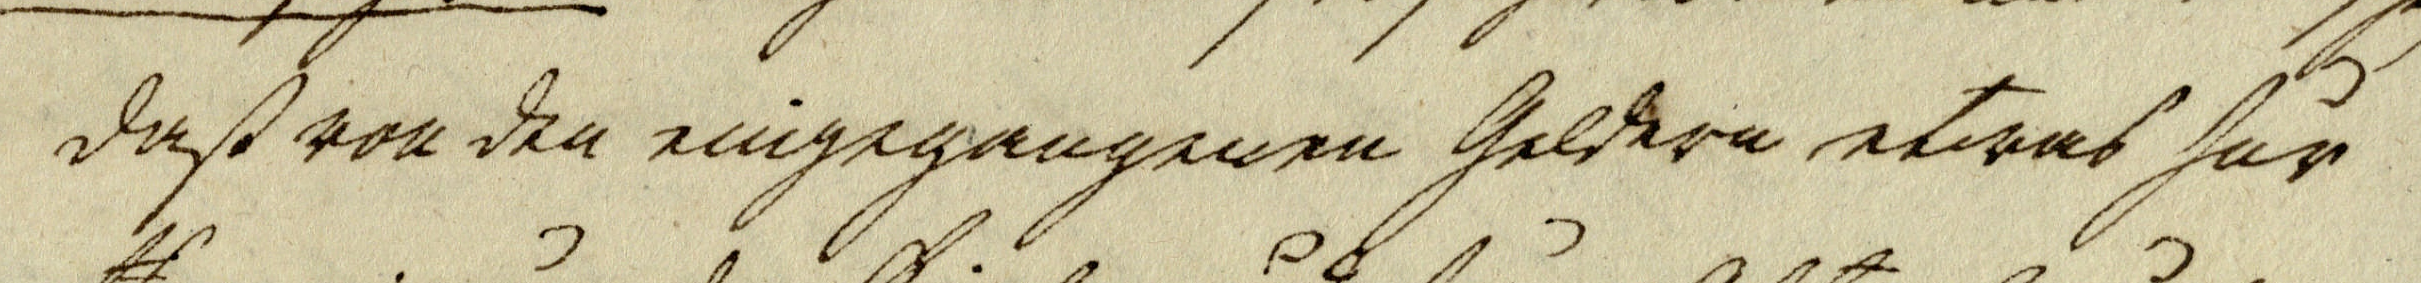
daß von den eingegangenen Geldern etwas zur
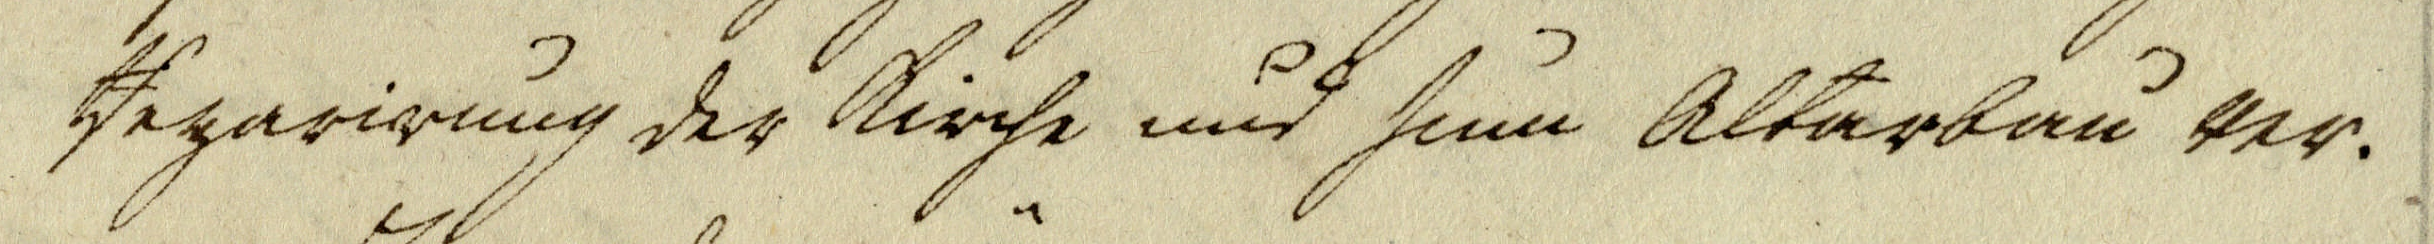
Reparirung der Kirche und zum Altarbau ver¬
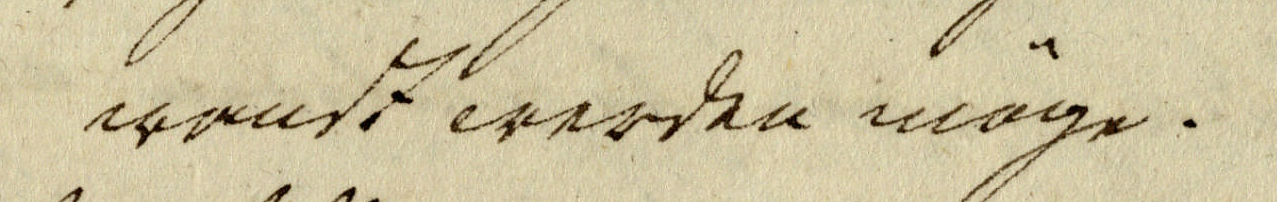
wandt werden möge.
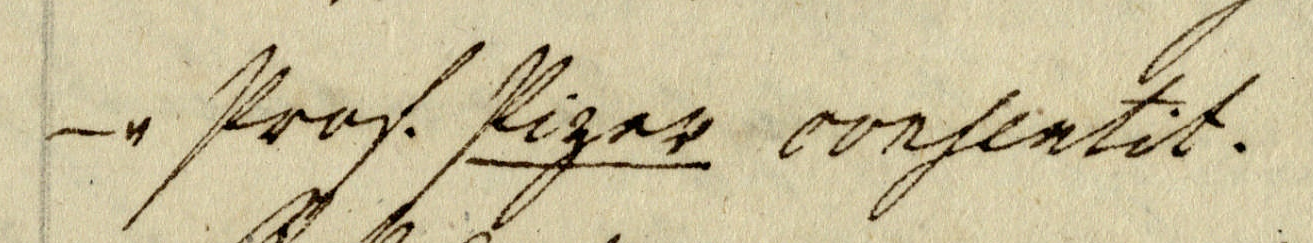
Prof. Piper consentit.
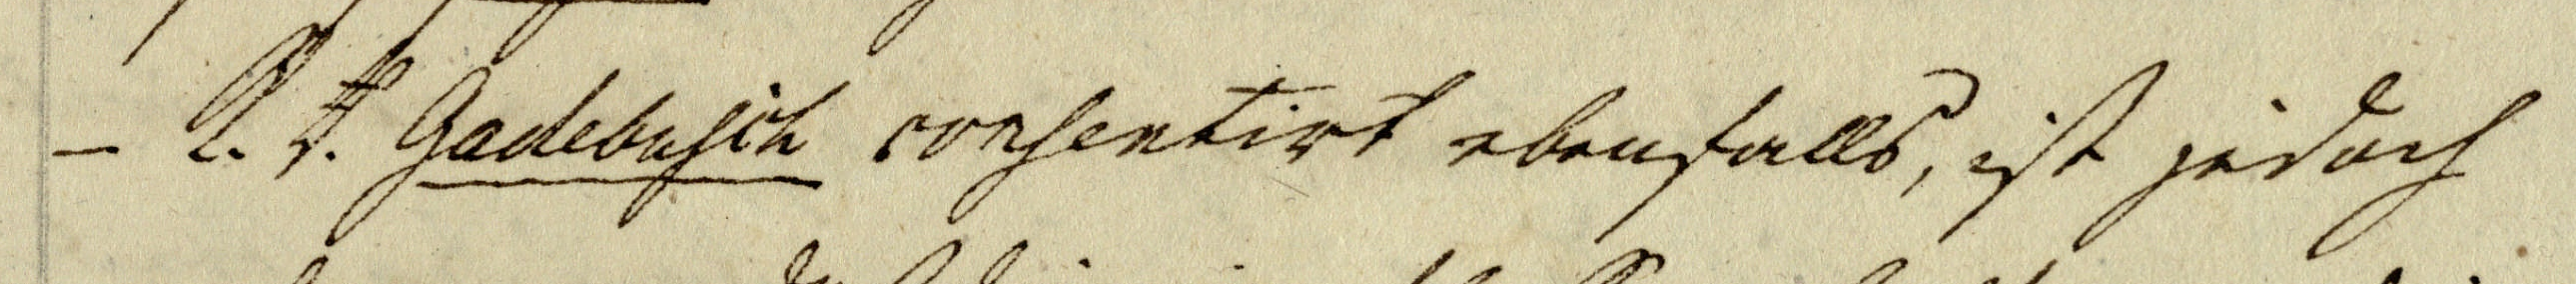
K.R. Gadebusch consentirt ebenfalls, ist jedoch
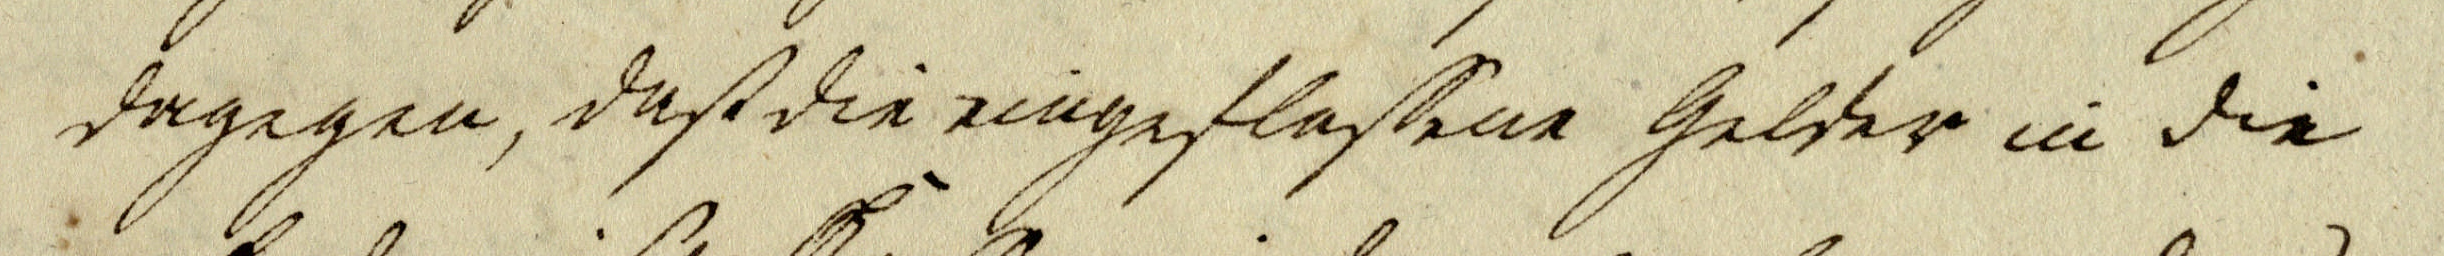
dagegen, daß die eingeflossene Gelder in die
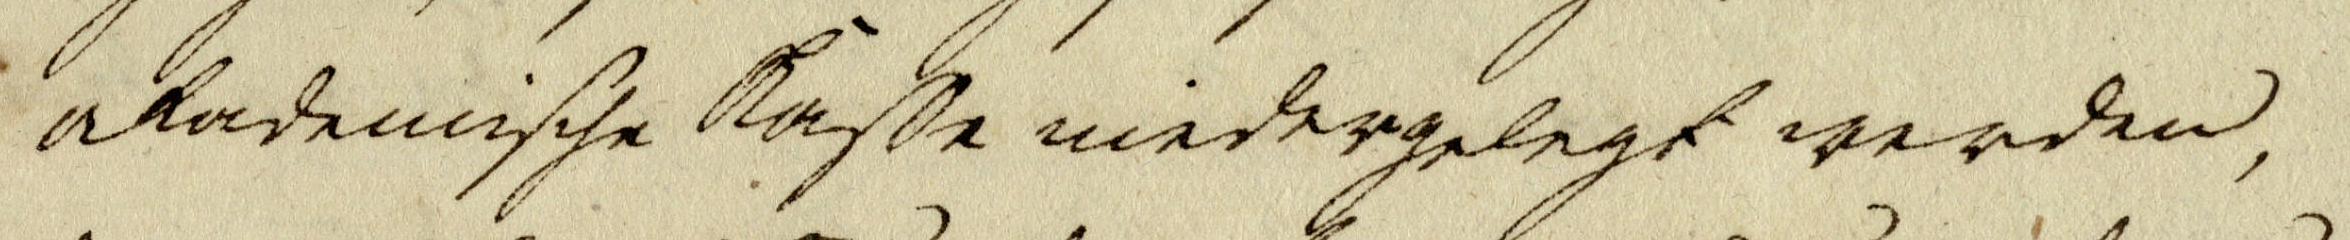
akademische Casse niedergelegt werden,
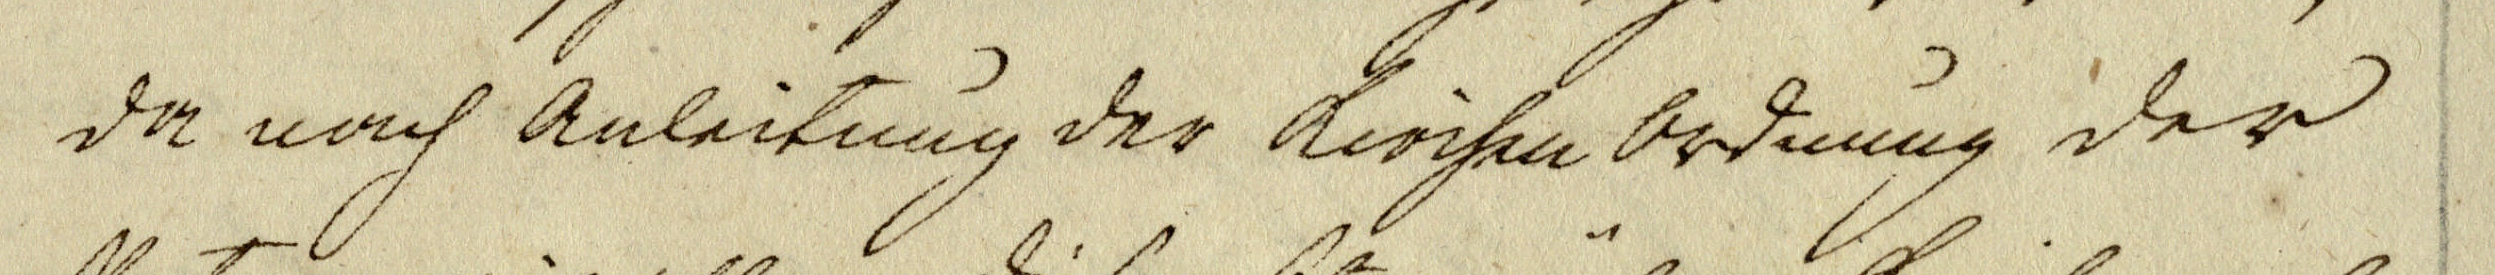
da nach Anleitung der Kirchenordnung der
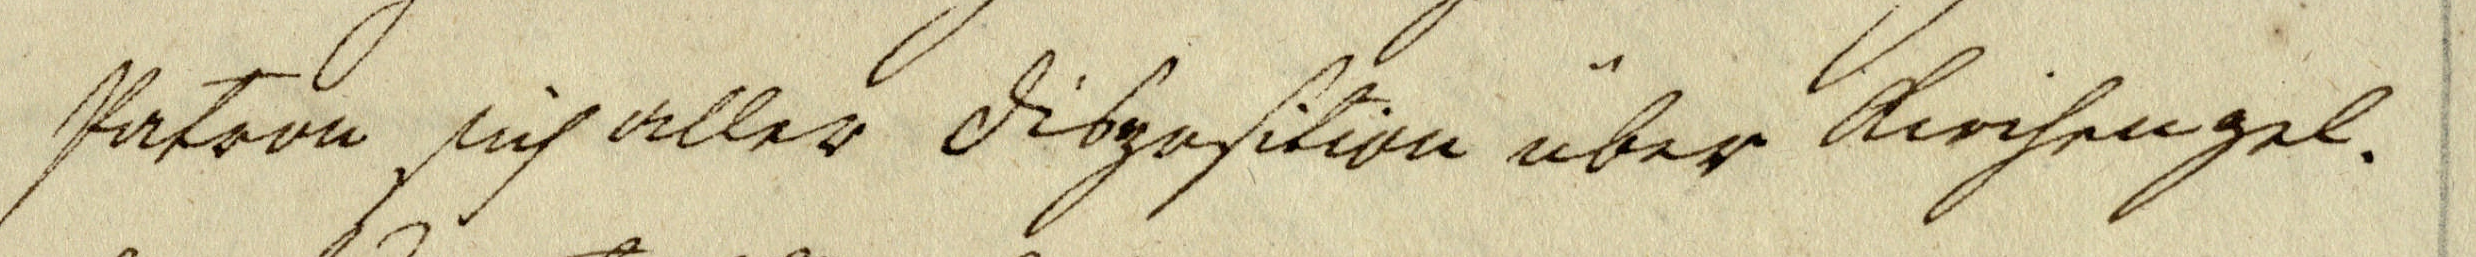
Patron sich aller Disposition über Kichengel¬
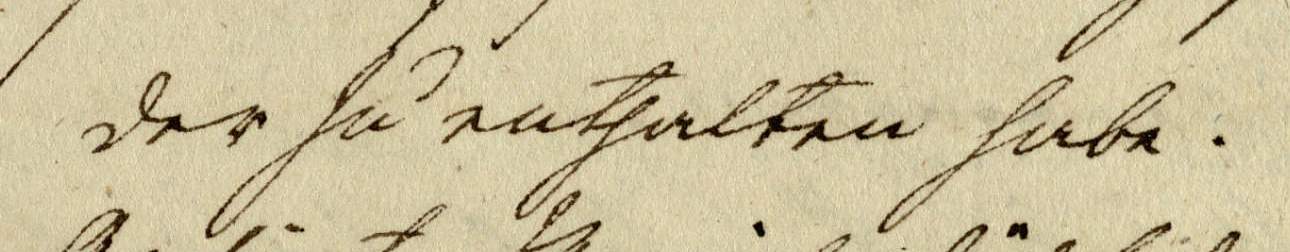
der zu enthalten habe.
